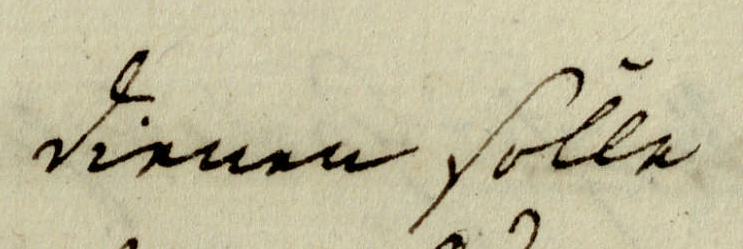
dienen solle
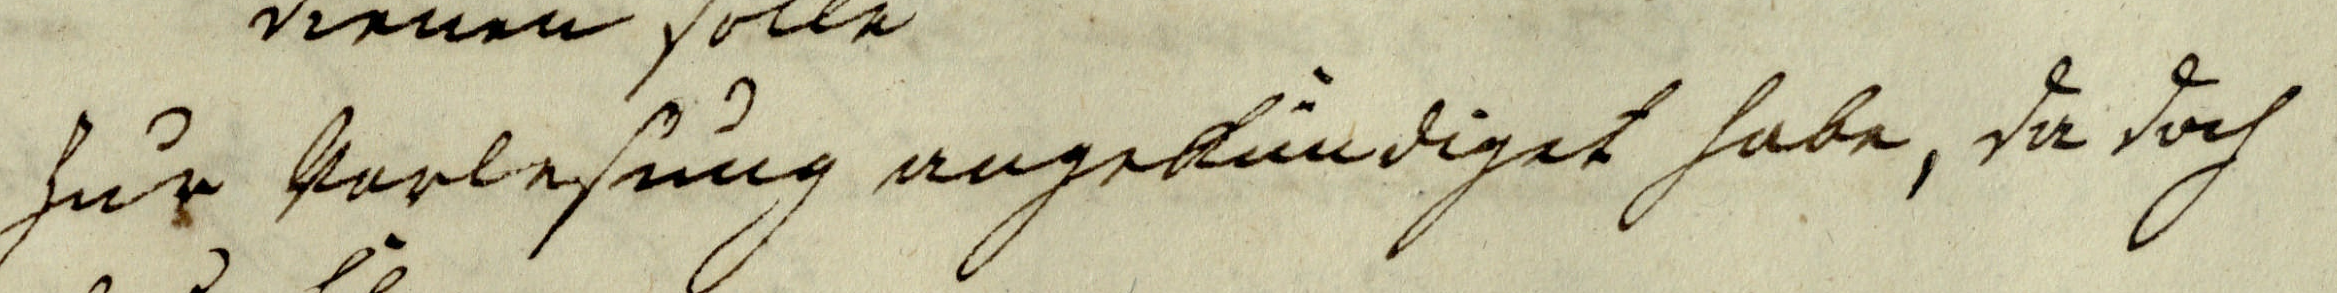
zur Vorlesung angekündiget habe, da doch
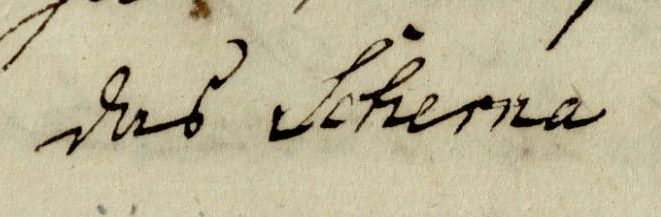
das Schema
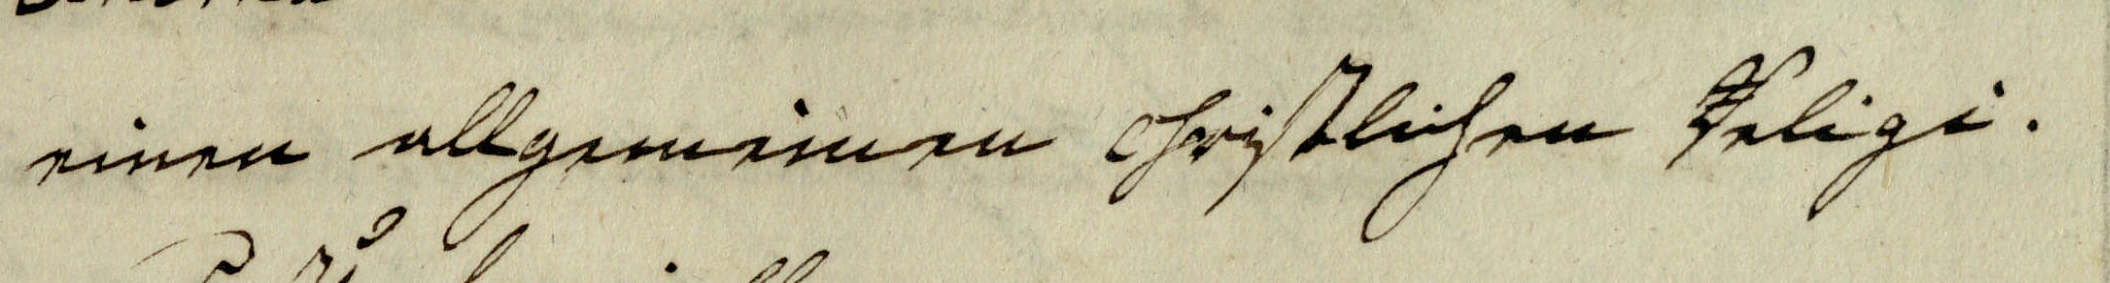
einen allgemeinen christlichen Religi¬
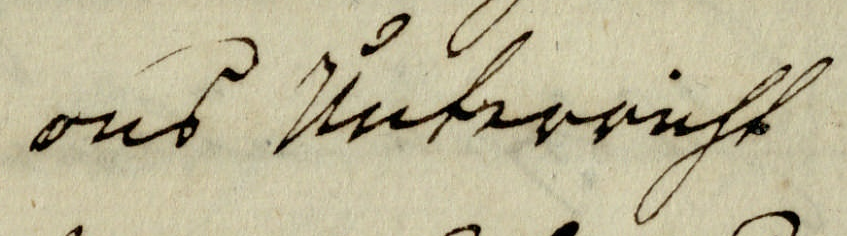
ons Unterricht
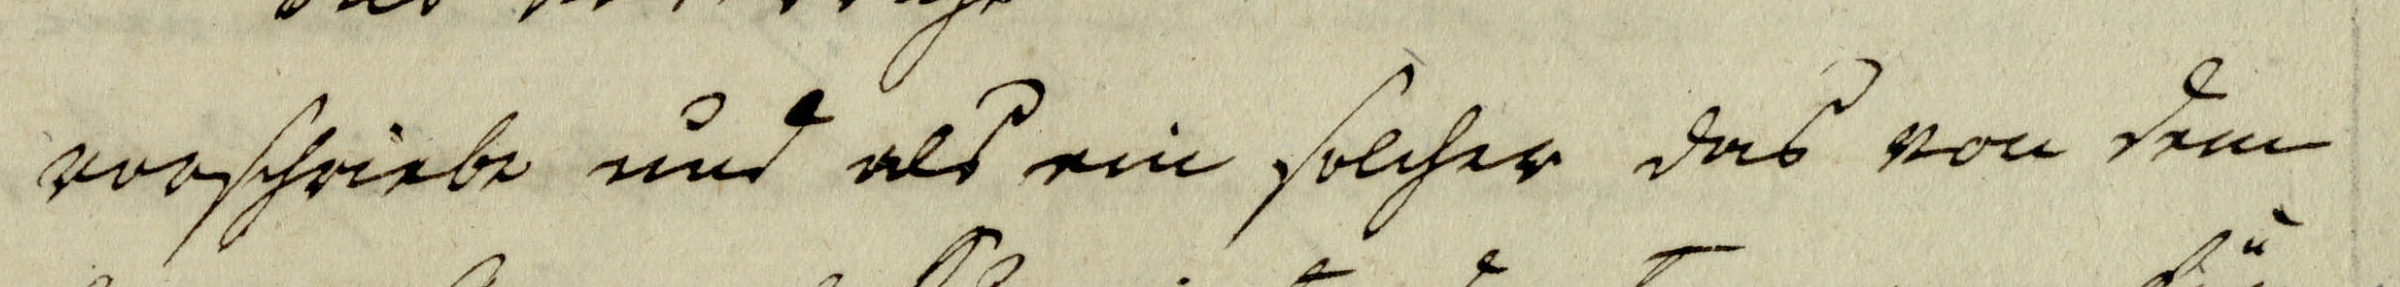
vorschriebe und als ein solcher das von dem
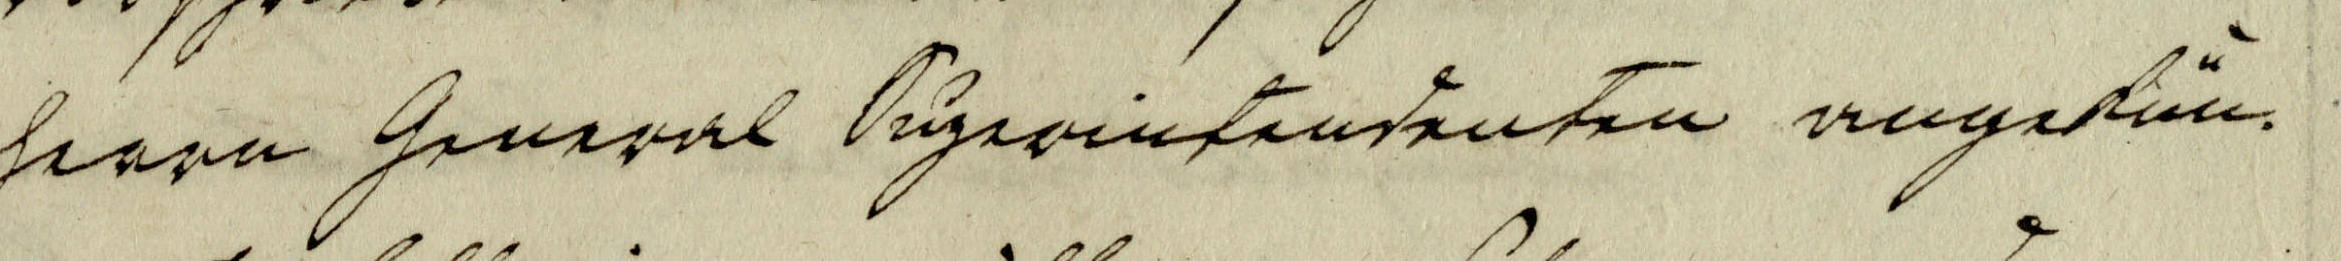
Herrn General Superintendenten angekün¬
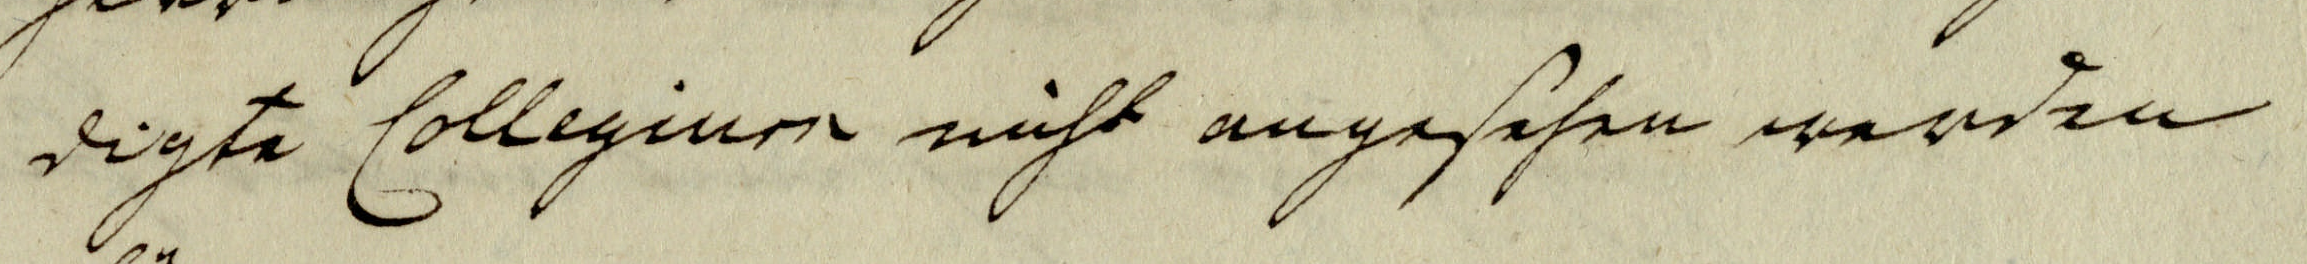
digte Collegium nicht angesehen werden
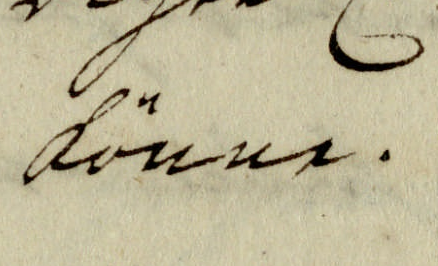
könne.
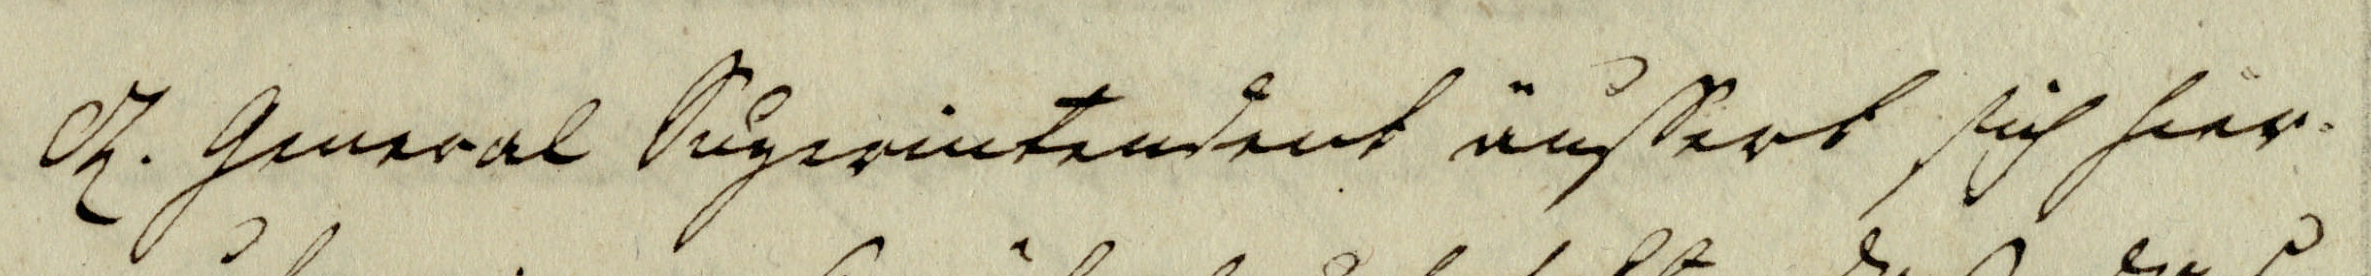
dh. General Superintendent äussert sich hier¬
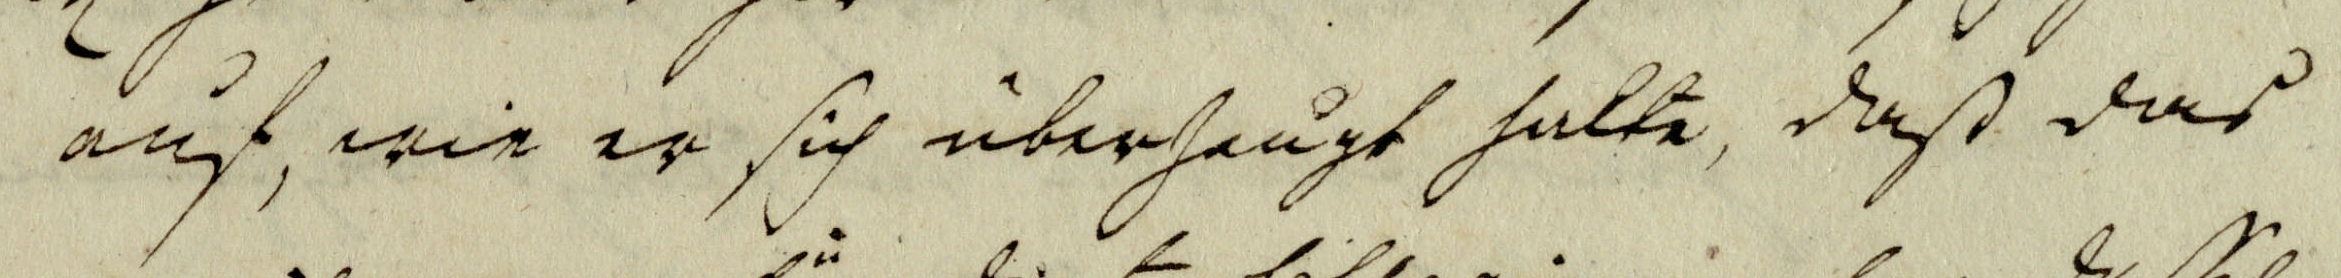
auf, wie er sich überzeugt halte, daß das
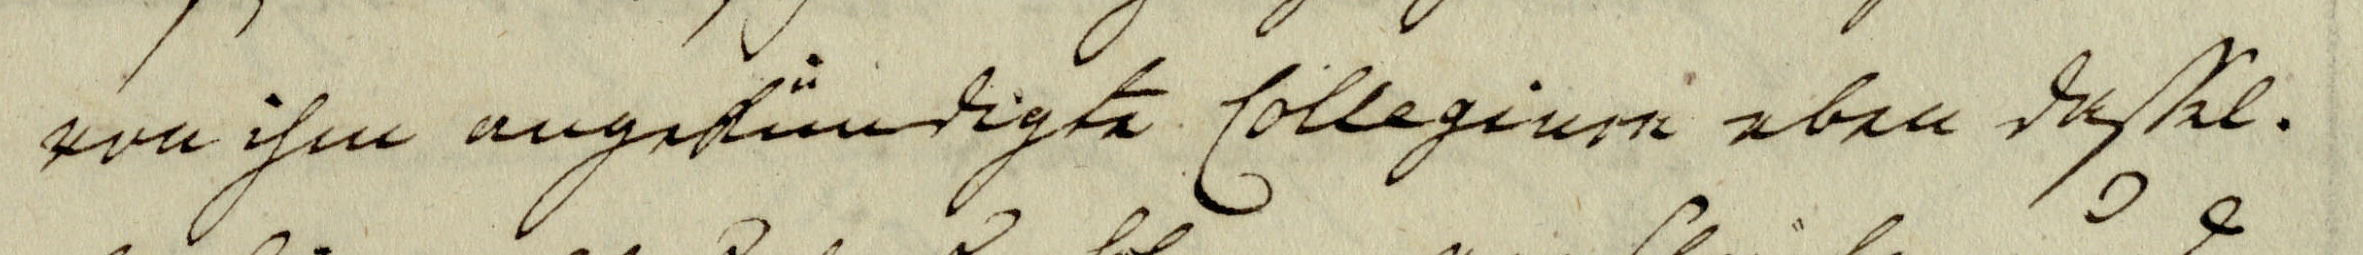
von ihm angekündigte Collegium eben dassel¬
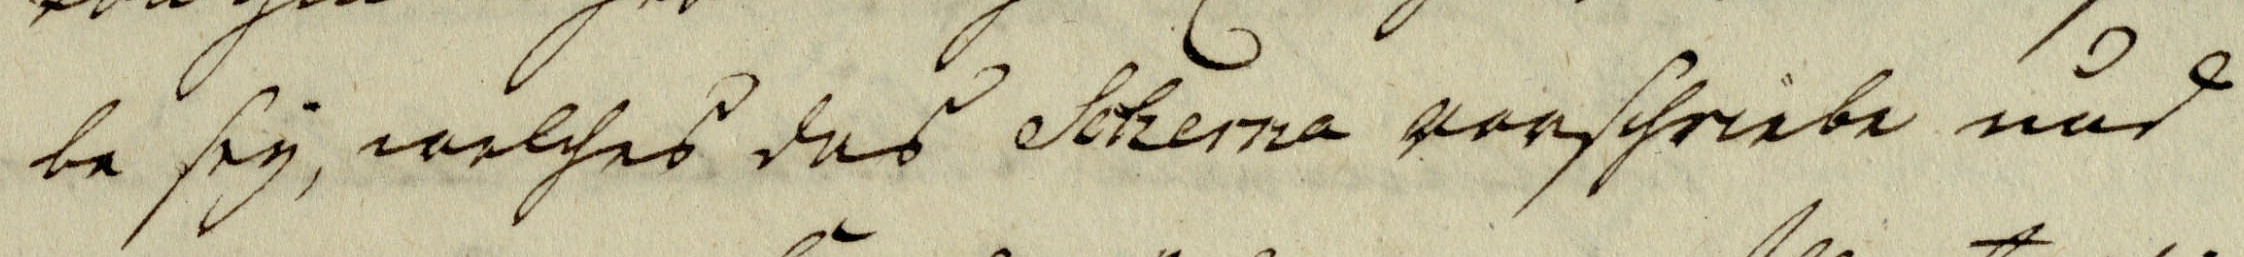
be seÿ, welches das Schema vorschriebe und
